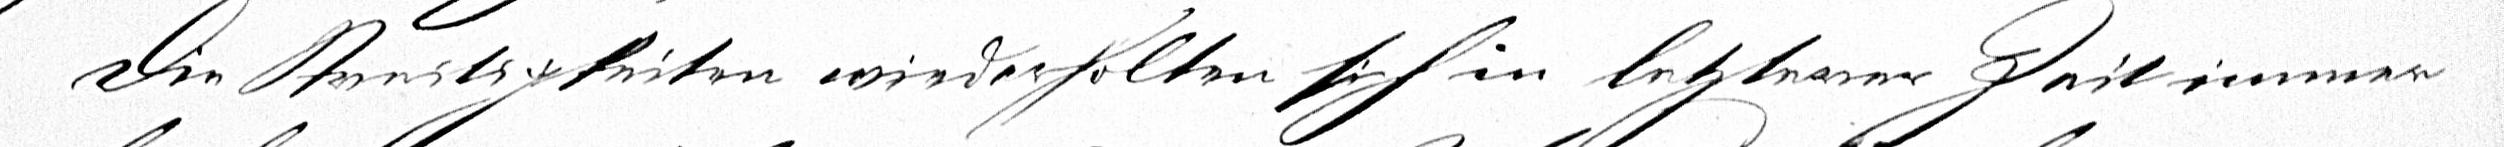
Die Streitigkeiten wiederholten sich in letzterer Zeit immer
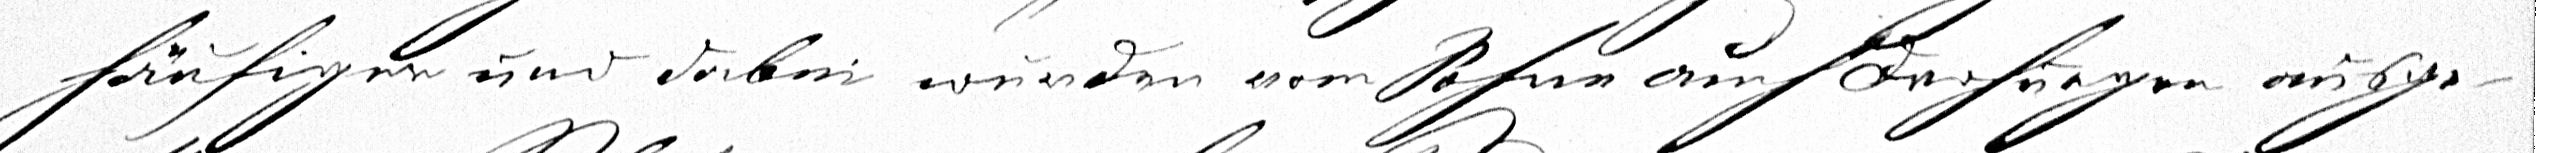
häufigen und dabei wurden vom Sohne auch Drehungen ausge¬
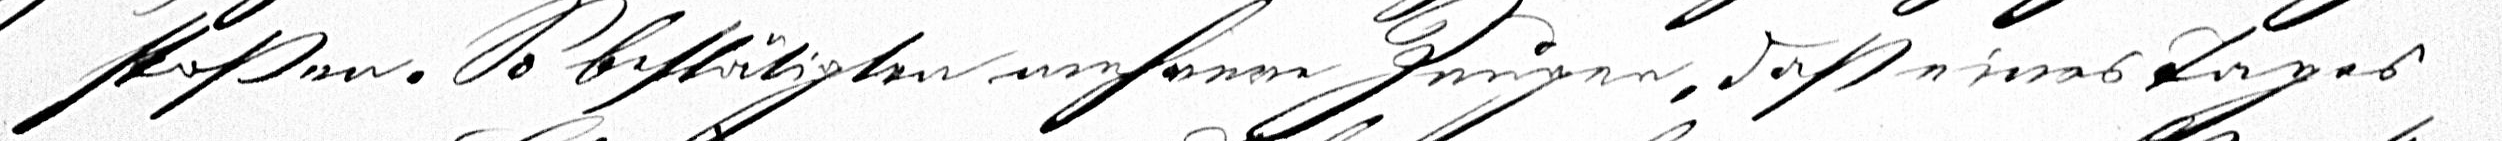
stoßen. So bestätigten mehrere Zungen, daß eines Tages
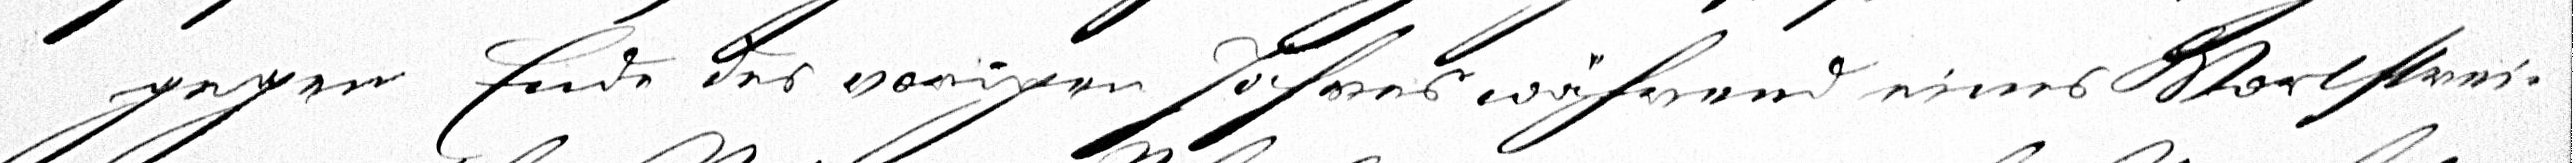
gegen Ende des vorigen Jahres während eines Wortstrei¬
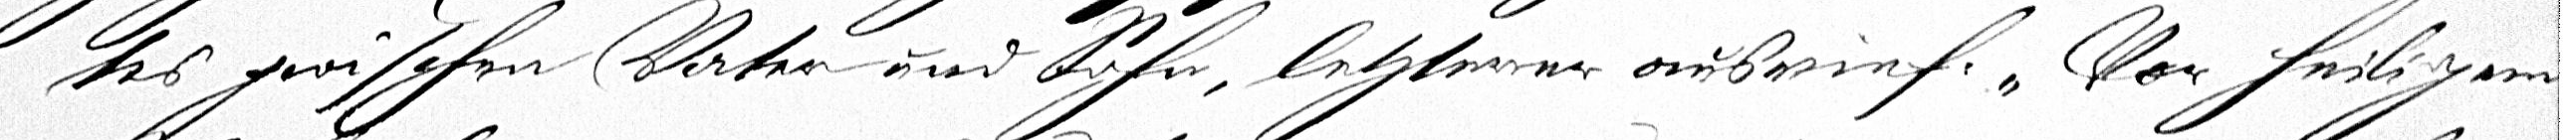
tes zwischen Vater und Sohn, letzterer ausrief. „Vor heiligem
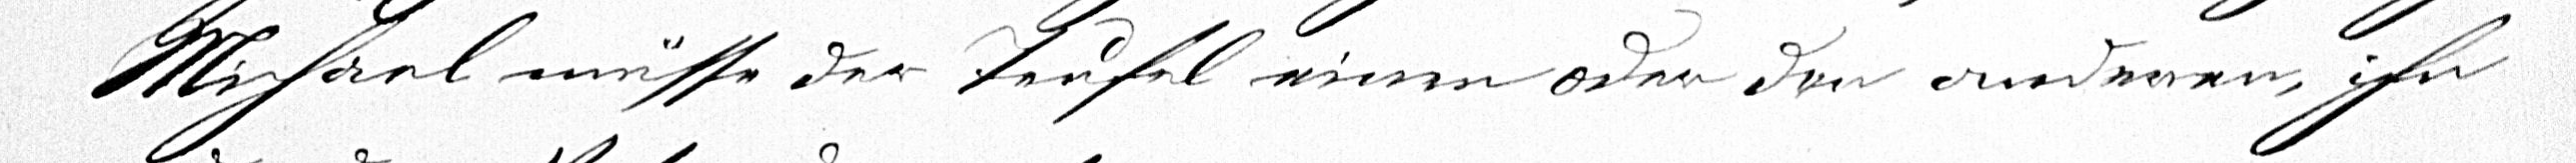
Michael müsse der Teufel einen oder der anderen, ihn
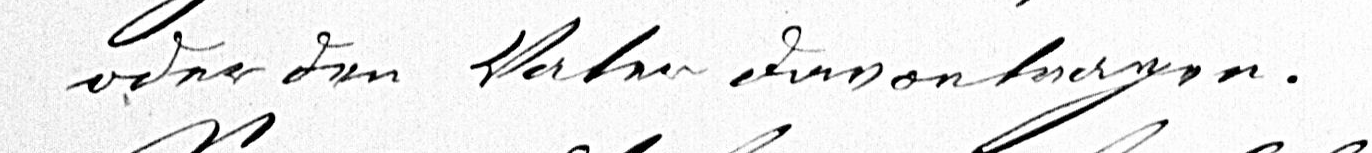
oder den Vater davontragen.
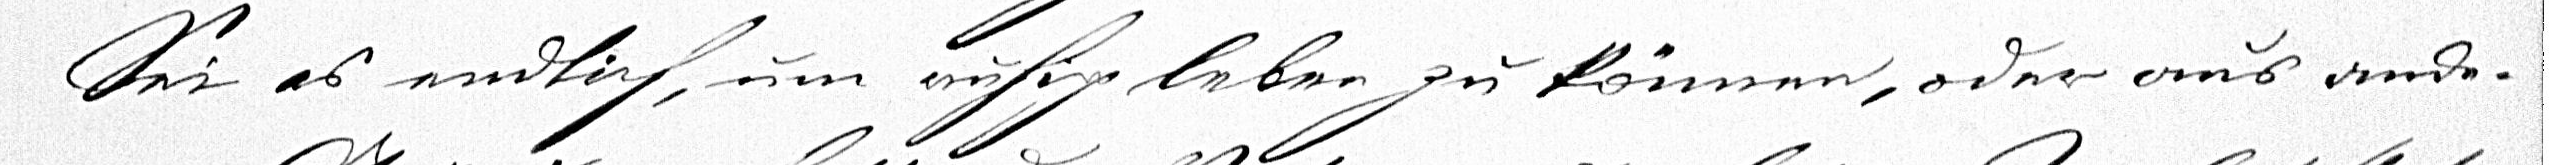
Sei es endlich, um ruhig leben zu können, oder aus ande¬
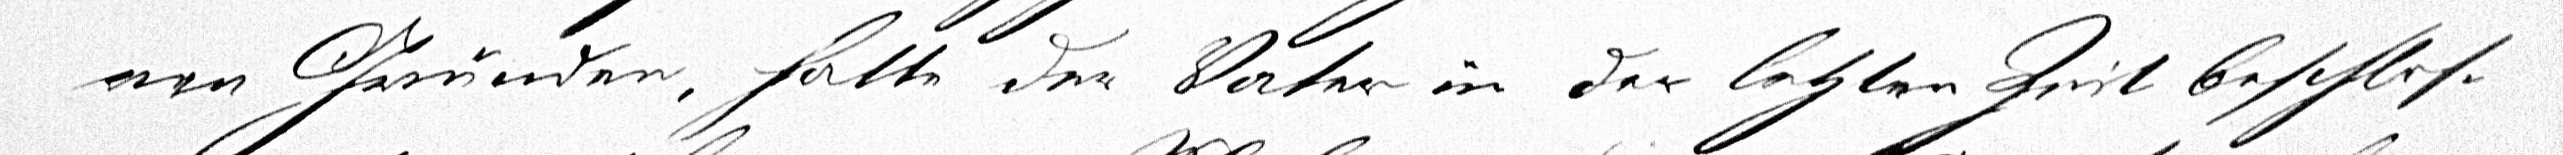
ren Gründen, hatte der Vater in der letzten Zeit beschlos¬
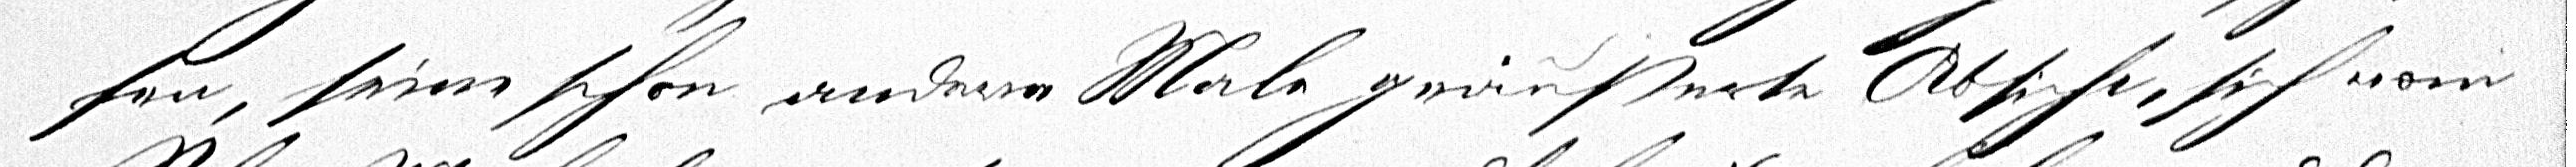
sen, seine schon andern Male geäußerte Absicht, sich vom
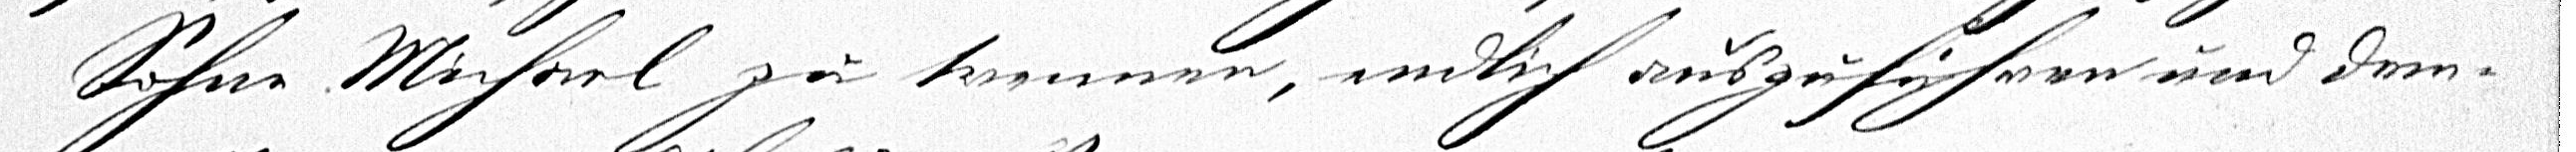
Sohne Michael zu trennen, endlich auszuführen und dem¬
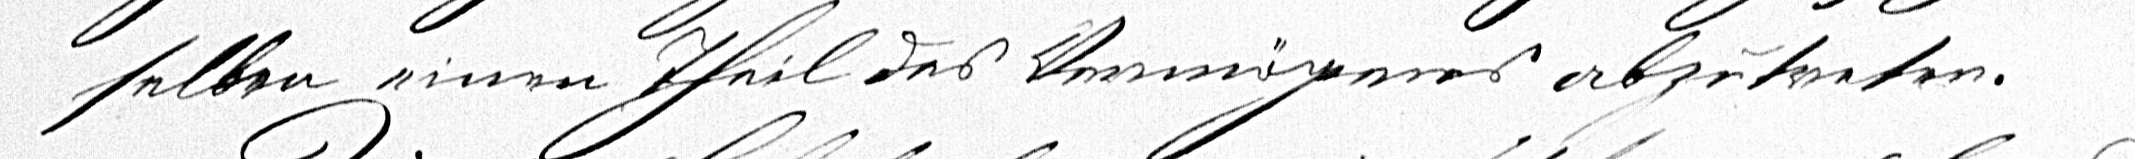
selben einen Theil des Vermögens abzutreten.
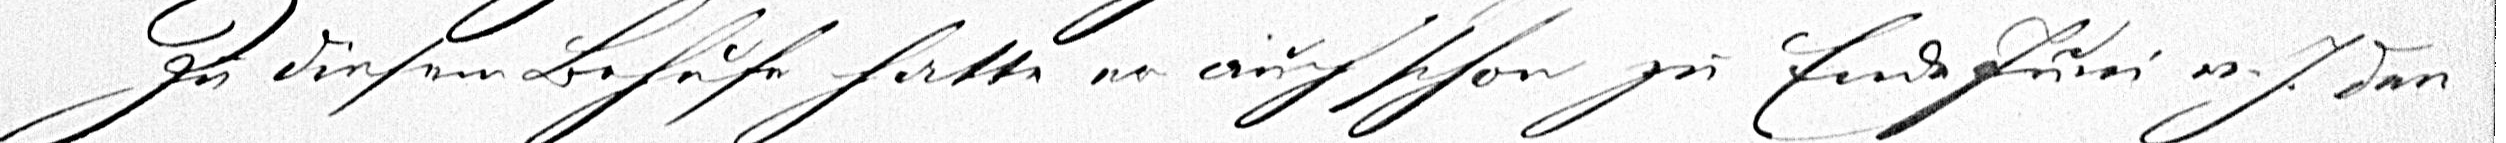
Zu diesen Behufe hatte er auch schon zu Ende Juni v. J. den
